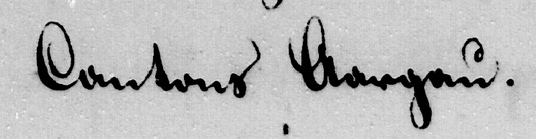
Cantons Aargau.
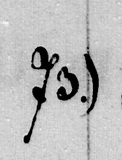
78.)
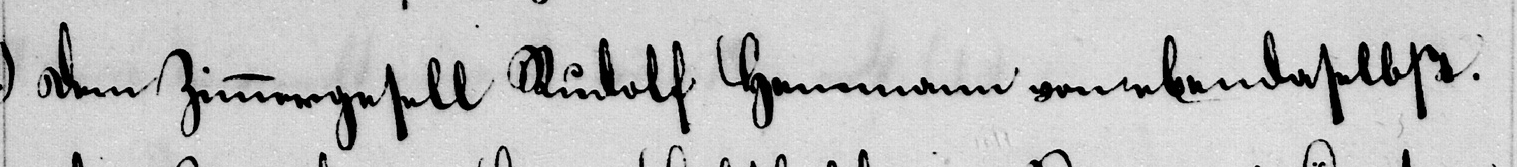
Dem Zimmergesell Rudolf Hermann von ebendaselbst.
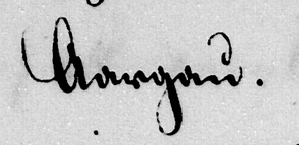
Aargau.
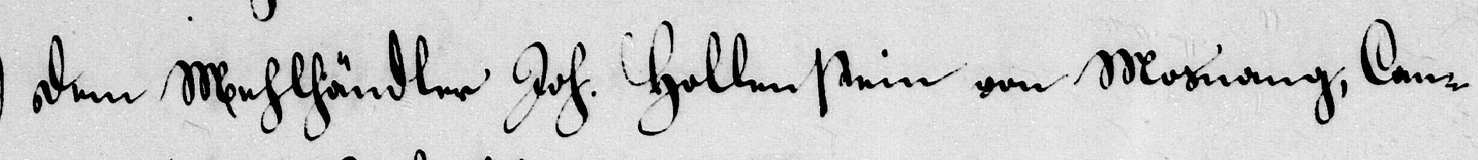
Dem Mehlhändler Joh. Hollenstein von Mosnang, Can¬
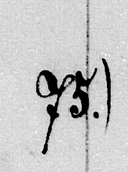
74.)
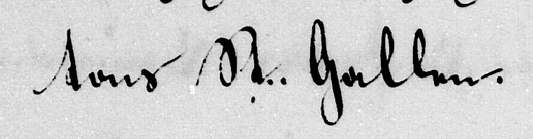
tons St. Gallen.
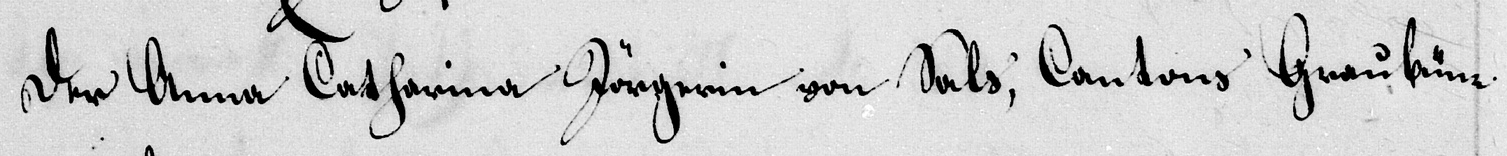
Der Anna Catharina Jörgerin von Vals, Cantons Graubün¬
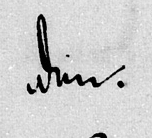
den.
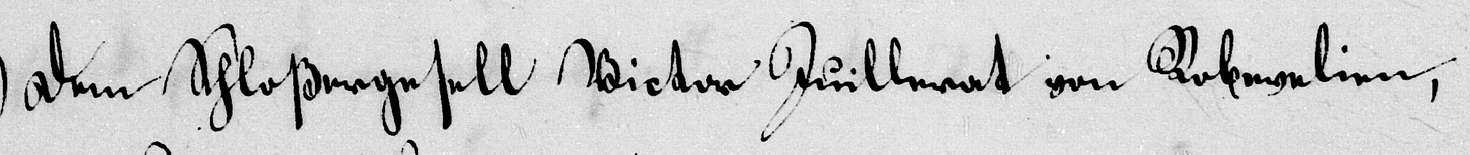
Dem Schloßergesell Victor Juillerat von Robevelien,
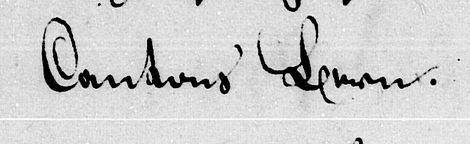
Cantons Bern.
